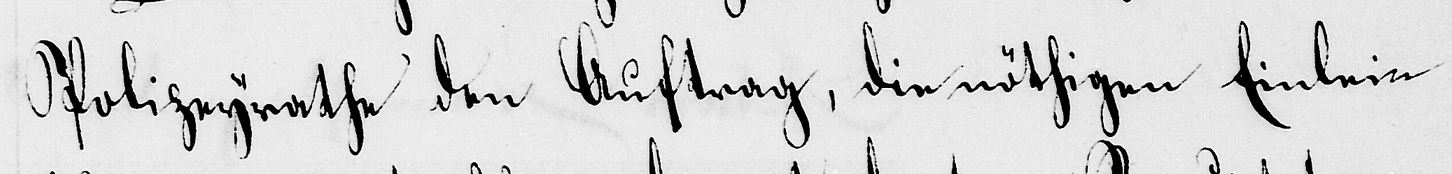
Polizeyrathe den Auftrag, die nöthigen Einlei¬
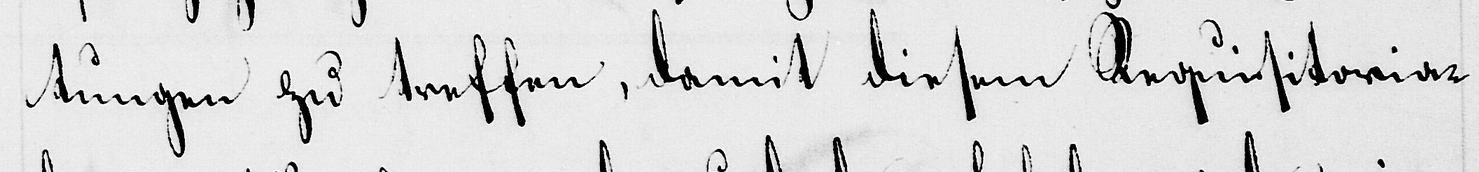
tungen zu treffen, damit diesem Requisitoria¬
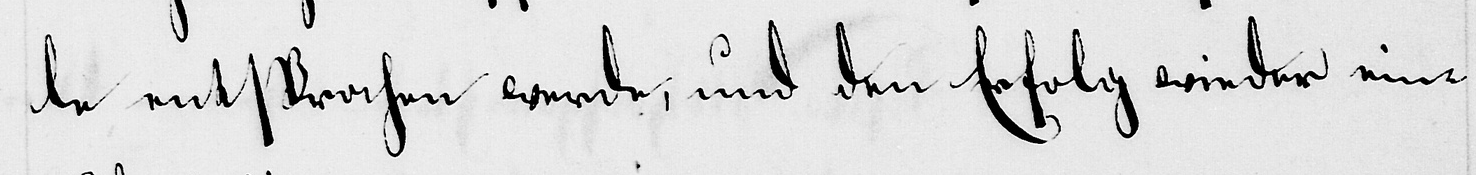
le entsprochen werde, und den Erfolg wieder ein¬
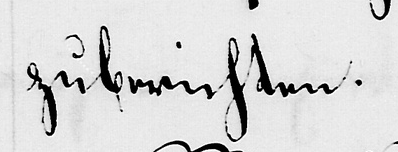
zuberichten.
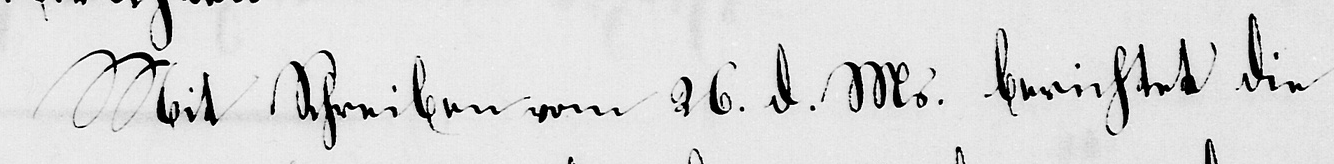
Mit Schreiben vom 26. d. Ms. berichtet die
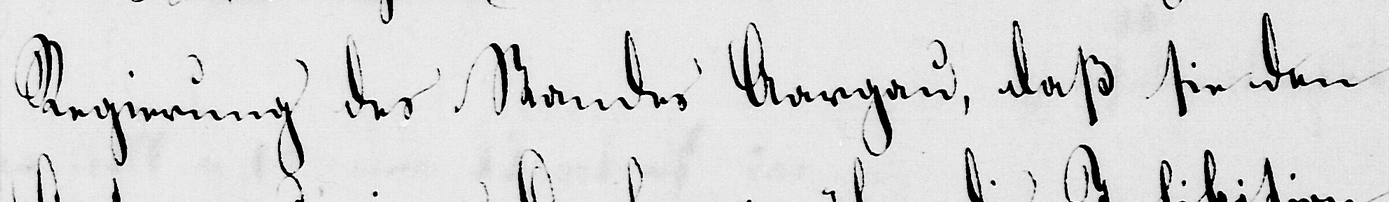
Regierung des Standes Aargau, daß sie den
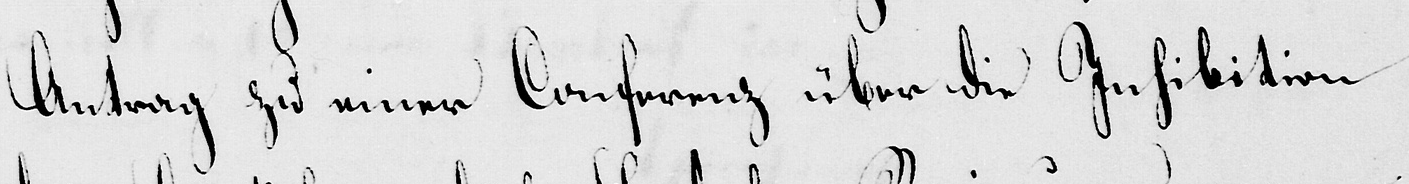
Antrag zu einer Conferenz über die Inhibition
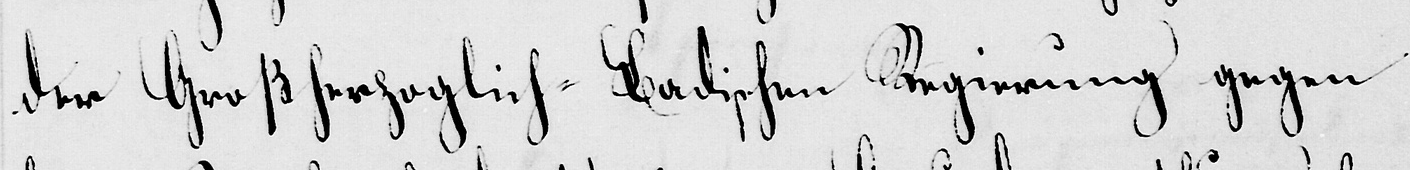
der Großherzoglich-Badischen Regierung gegen
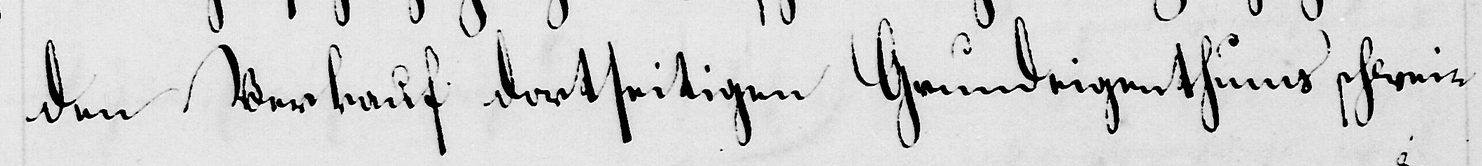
den Verkauf dortseitigen Grundeigenthums schwei-
